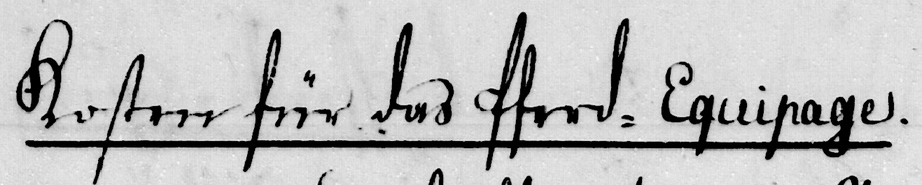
Kosten für das Pferd-Equipages.
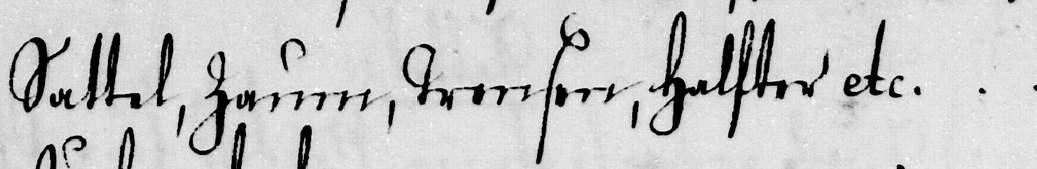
Sattel, Zaum, Trensen, Halfter etc.
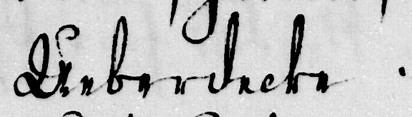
Ueberdecke
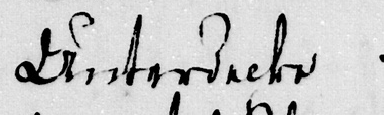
Unterdecke
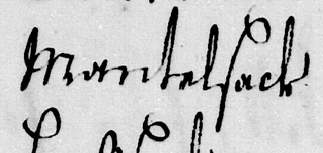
Mantelsack
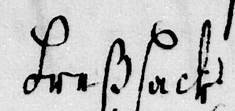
Freßsack
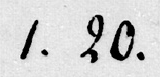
1.20.
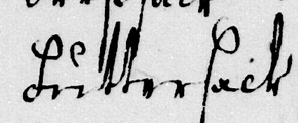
Futtersack
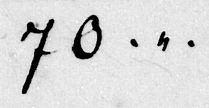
70.
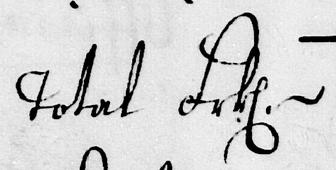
Total Frk[e¬
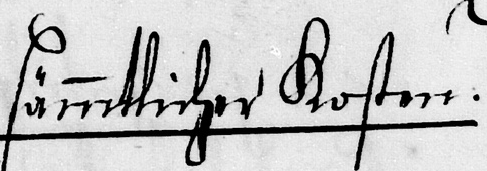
sämmtlicher Kosten.
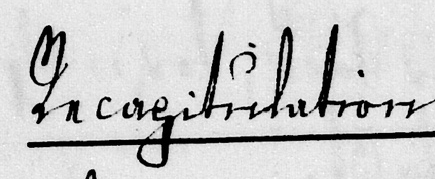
Recapitulation
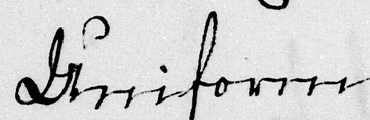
Uniform
